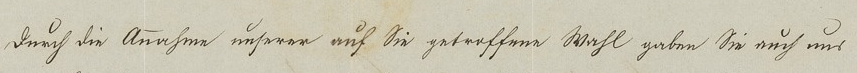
Durch die Annahme unserer auf Sie getroffene Wahl geben Sie auch uns
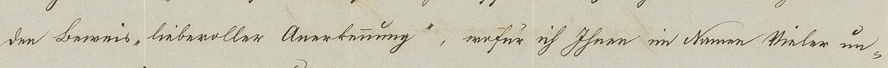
den Beweis «liebevoller Anerkennung», wofür ich Ihnen im Namen Vieler un-
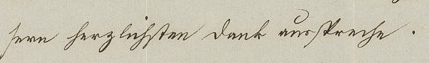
sern herzlichsten Dank ausspreche.
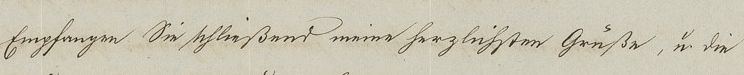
Empfangen Sie schließend meine herzlichsten Grüße, u. die
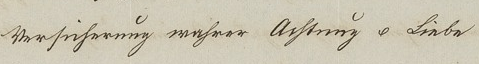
Versicherung wahrer Achtung & Liebe
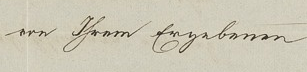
von Ihrem Ergebenen
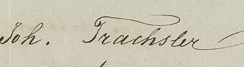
Joh. Trachsler
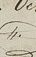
z.
